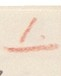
Rome
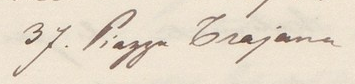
37. Piazza Trajana
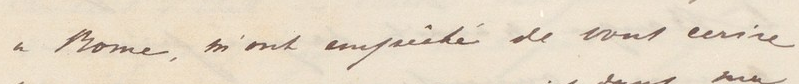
a Rome, m'ont empêché de vous ecrire
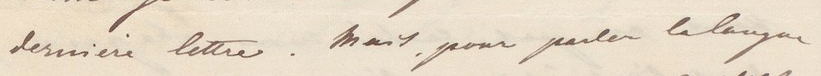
dernière lettre. Mais, pour parler la langue
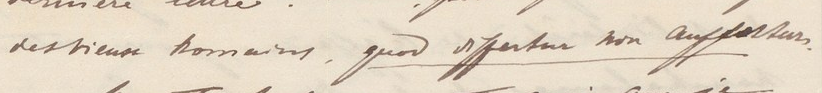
des vieux Romains, quod differtur non auffertur.
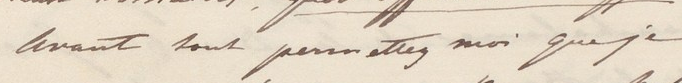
Avant tout permettez moi que je
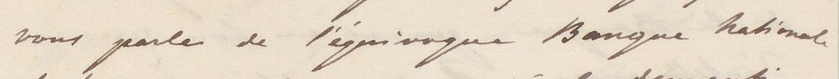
vous parle de l'équivoque Banque Nationale
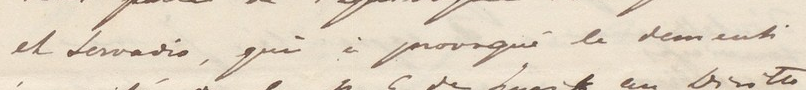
et Servadio, qui à provoqué le dementi
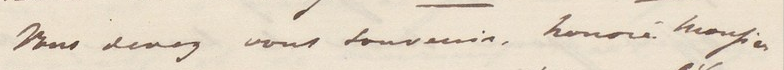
Vous devez vous souvenir, honoré Monsieur
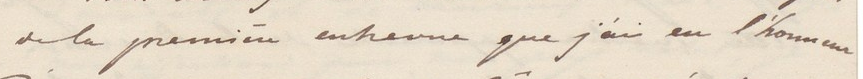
de la première entrevue que j'ai eu l'honneur
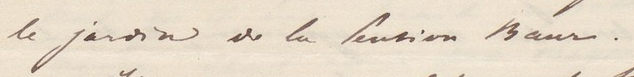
le jardin de la Pension Baur.
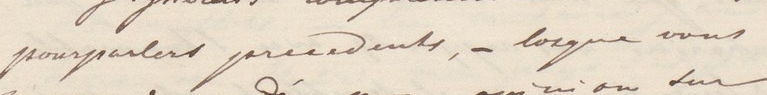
pourparlers precedents, – lorsque vous
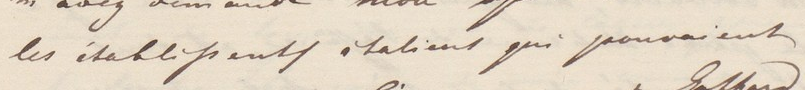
les établissements italiens qui pouvaient
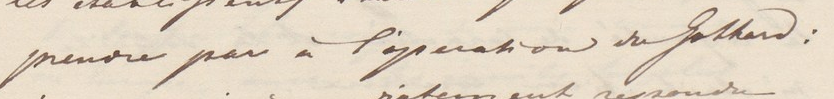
prendre par à l'operation du Gothard:
